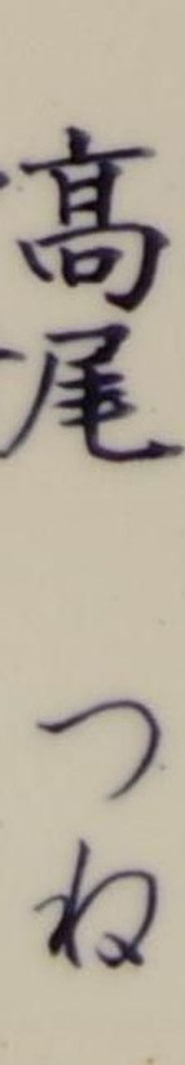高尾つね
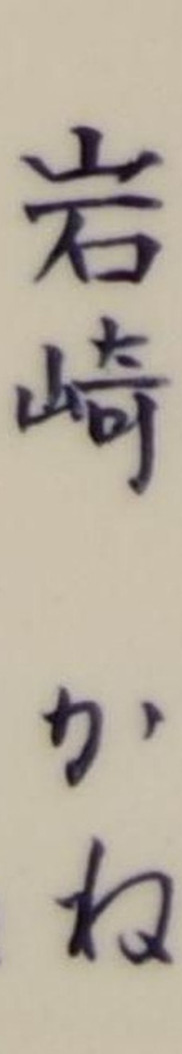岩崎かね
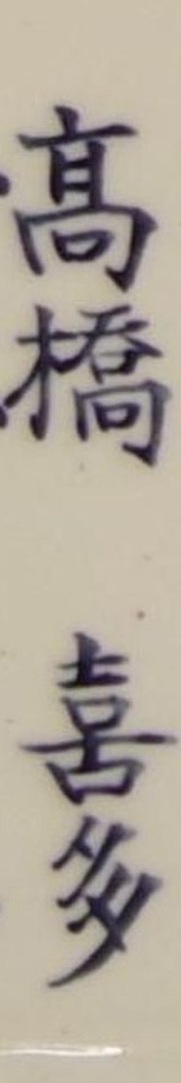高橋喜多
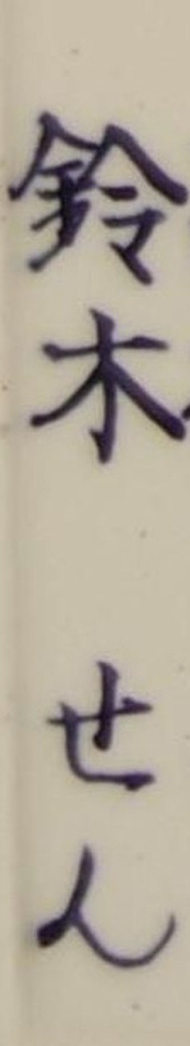鈴木せん

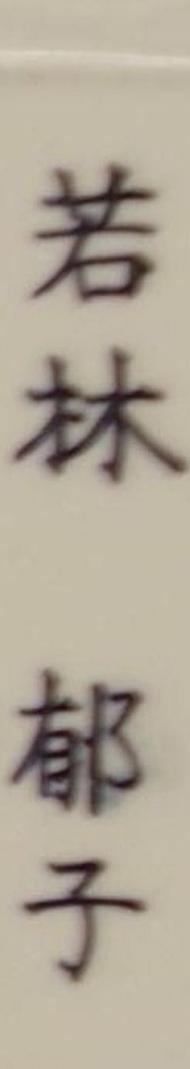若林郁子
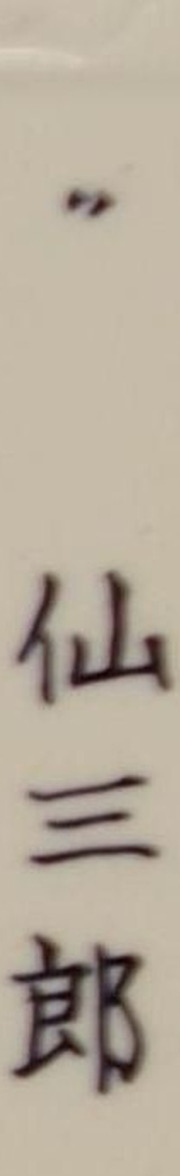仙三郎
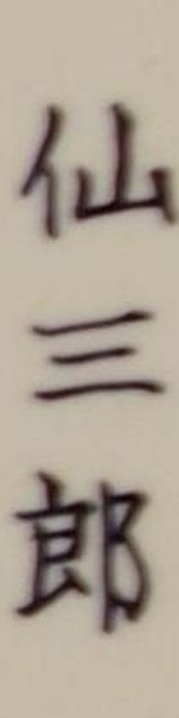仙三郎
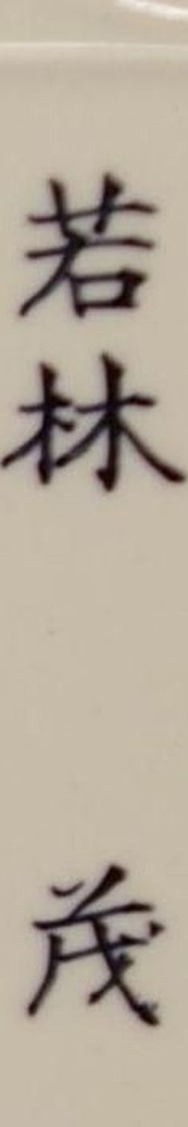若林茂
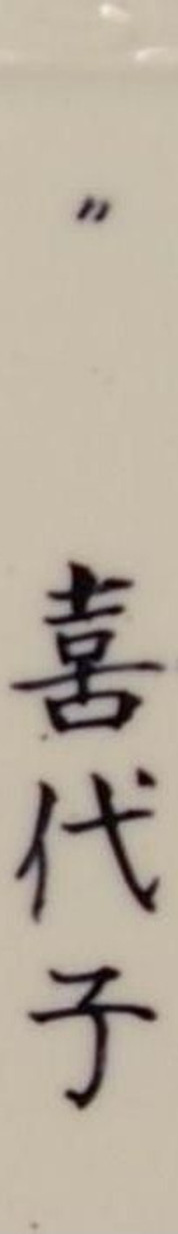喜代子
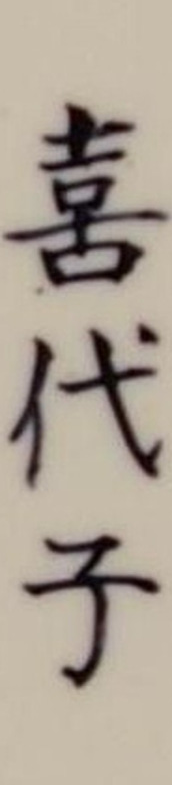喜代子
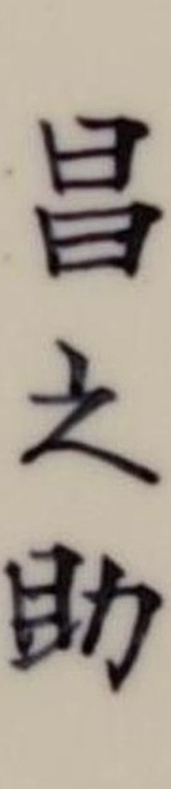昌之助
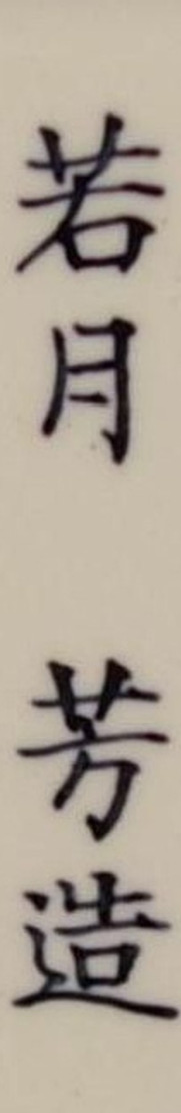若月芳造
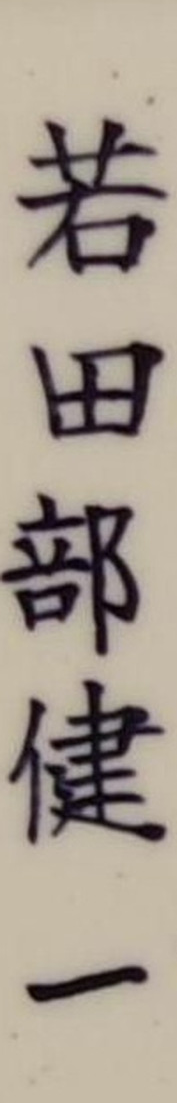若田部健一
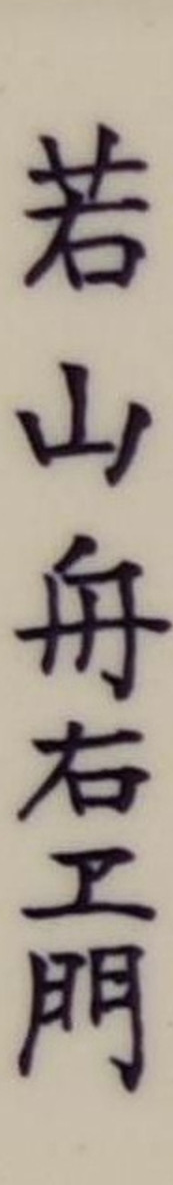若山舟右ヱ門
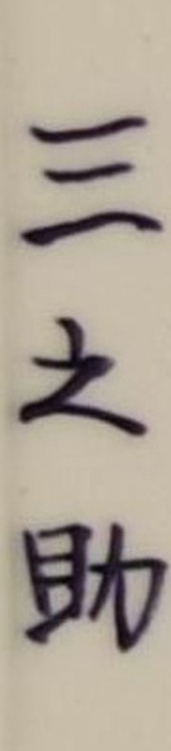三之助

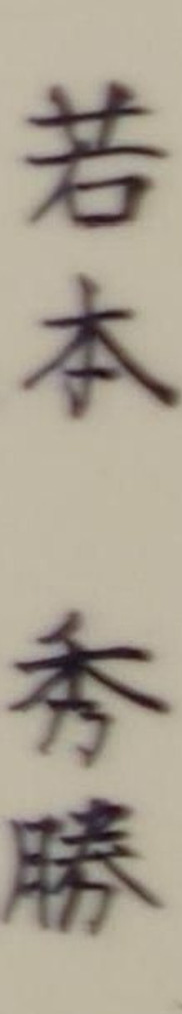若本秀勝
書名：M~S
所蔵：高野山金剛峯寺
